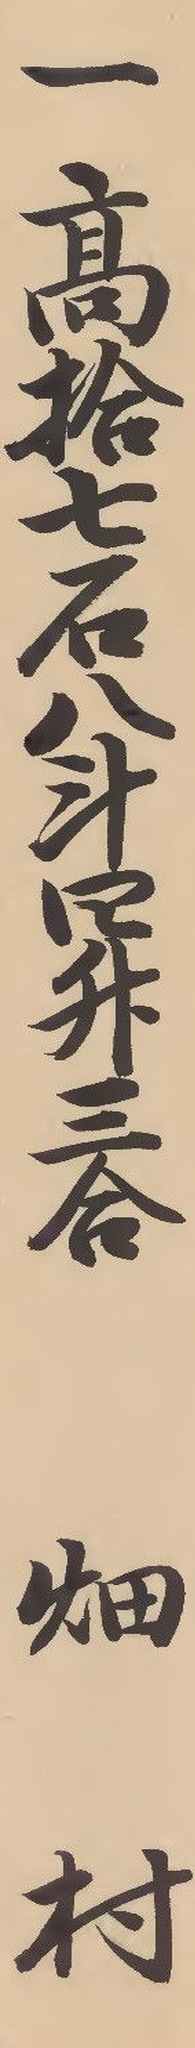一高拾七石八斗四升三合畑村
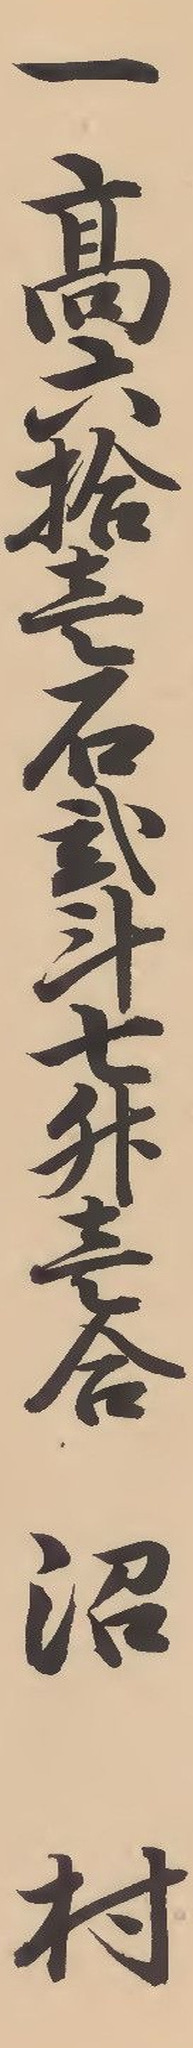一高六拾壱石弐斗七升壱合沼村
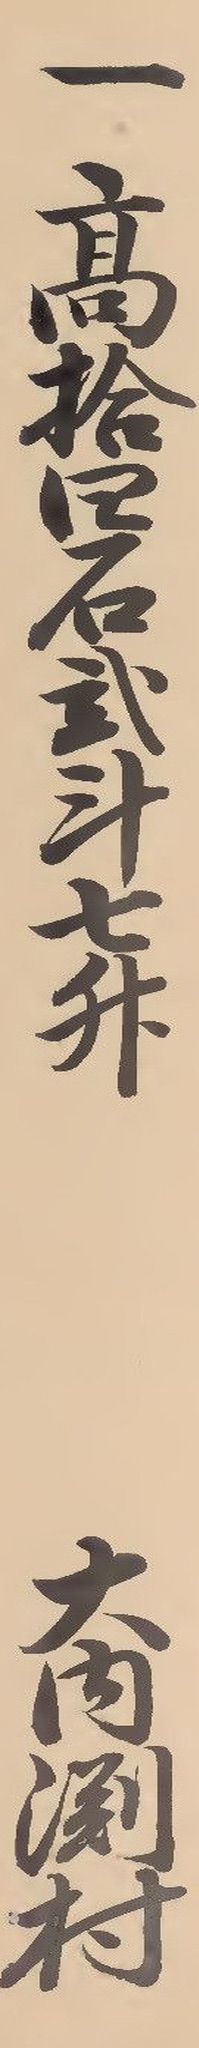一高拾四石弐斗七升大内淵村
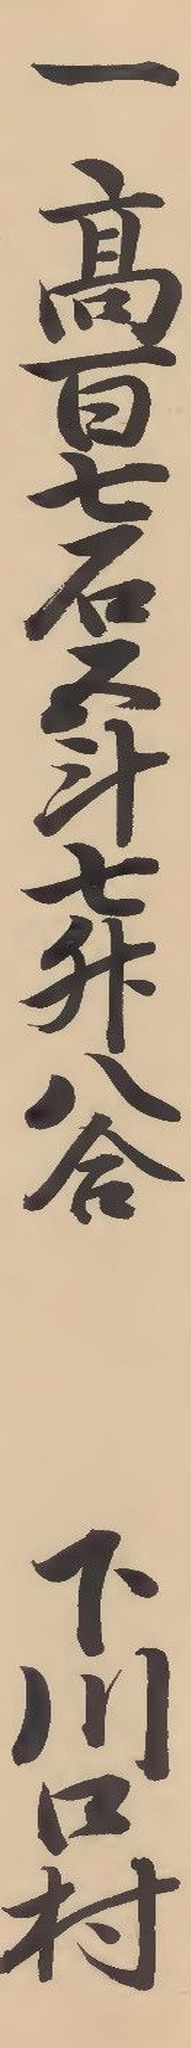一高百七石五斗七升八合下川口村
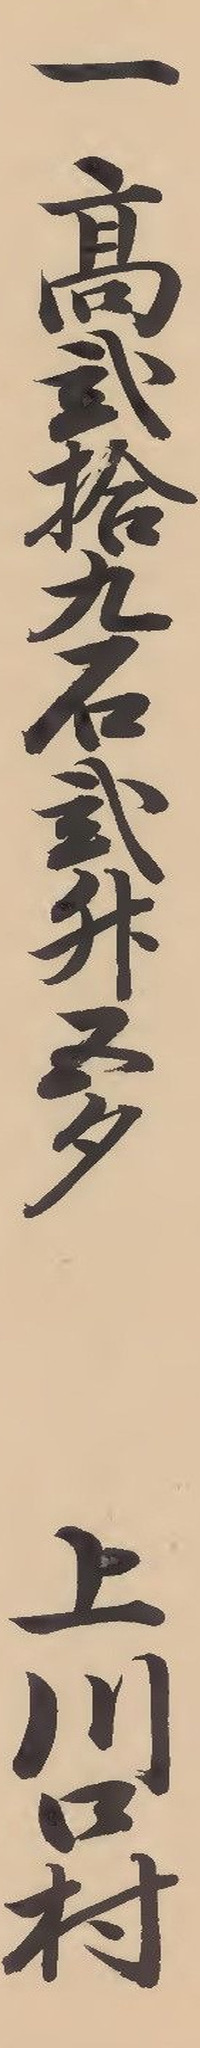一高弐拾九石弐升五勺上川口村
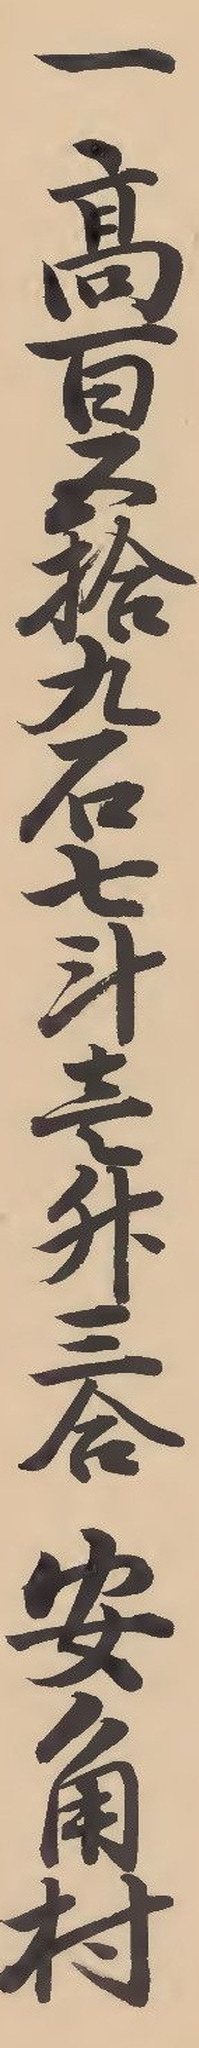一高百五拾九石七斗壱升三合安角村

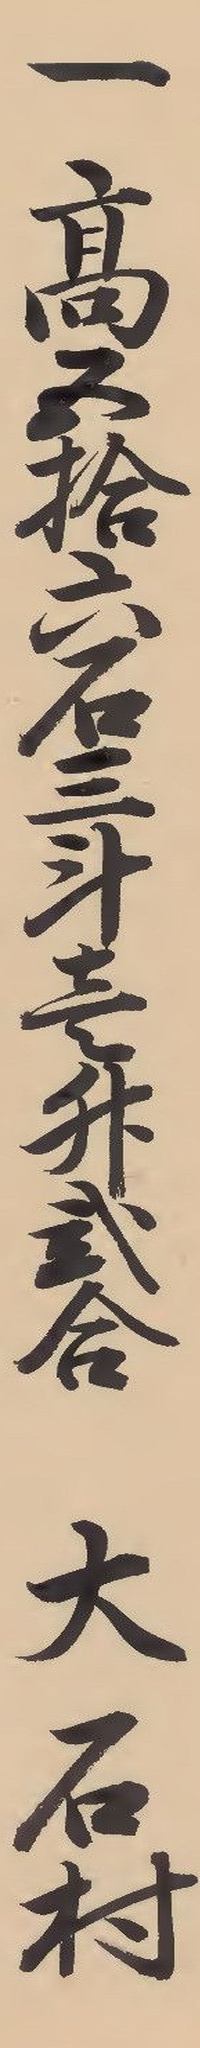一高五拾六石三斗壱升弐合大石村
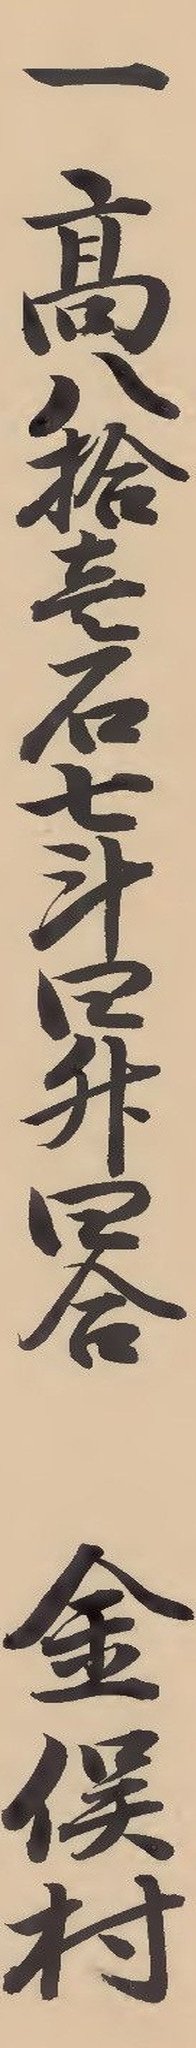一高八拾壱石七斗四升四合金俣村
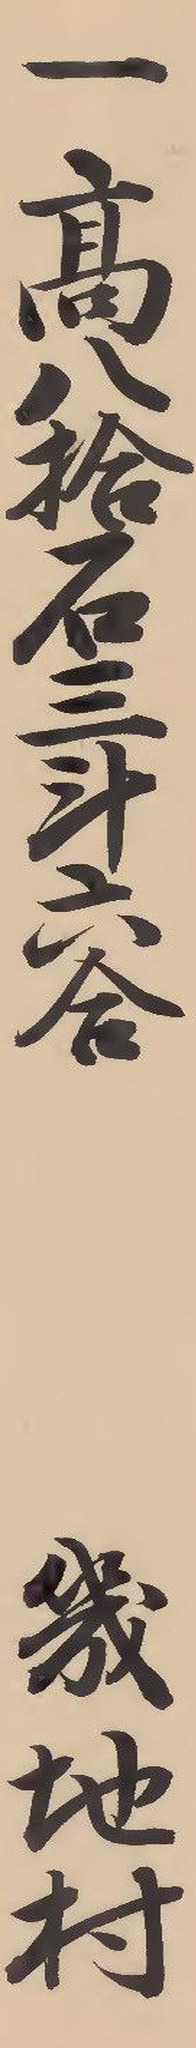一高八拾石三斗六合幾地村
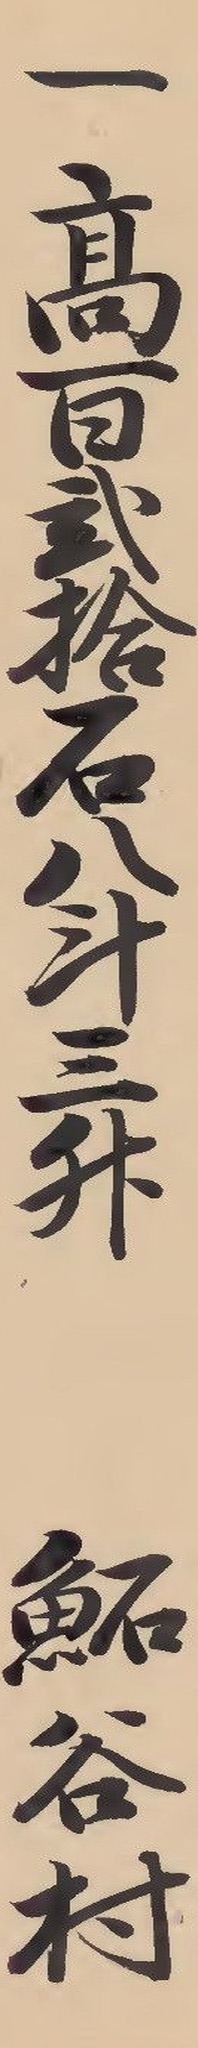一高百弐拾石八斗三升鮖谷村
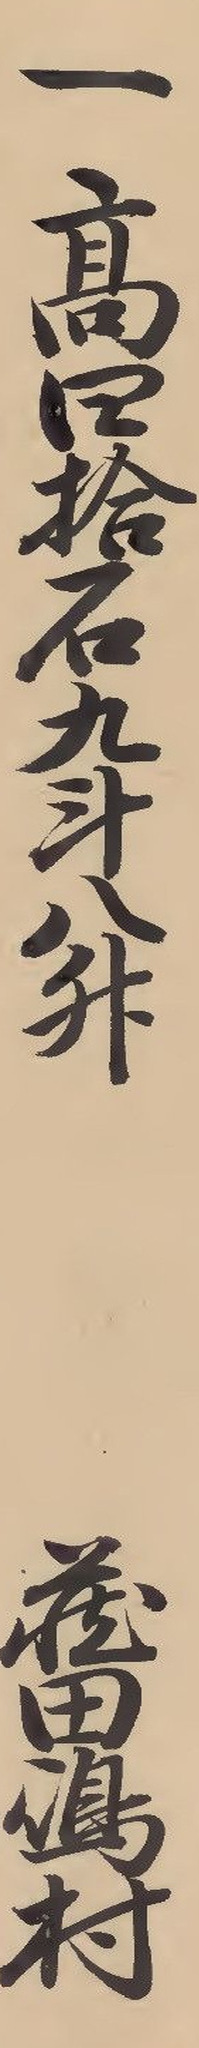一高四拾石九斗八升蔵田島村
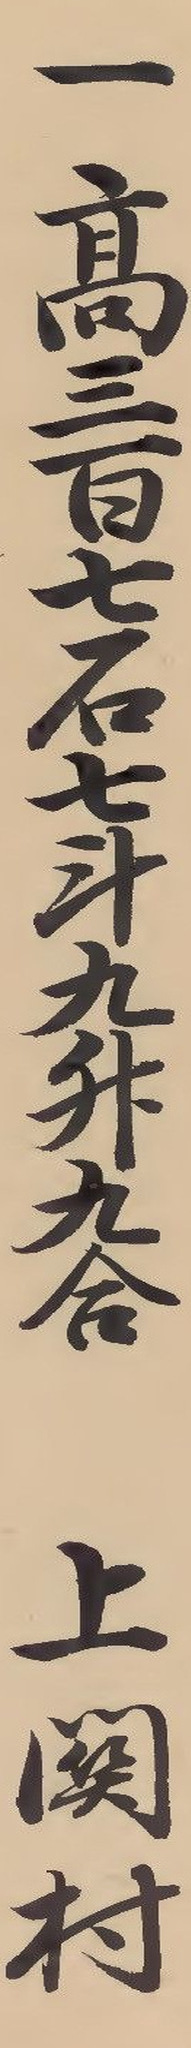一高三百七石七斗九升九合上関村
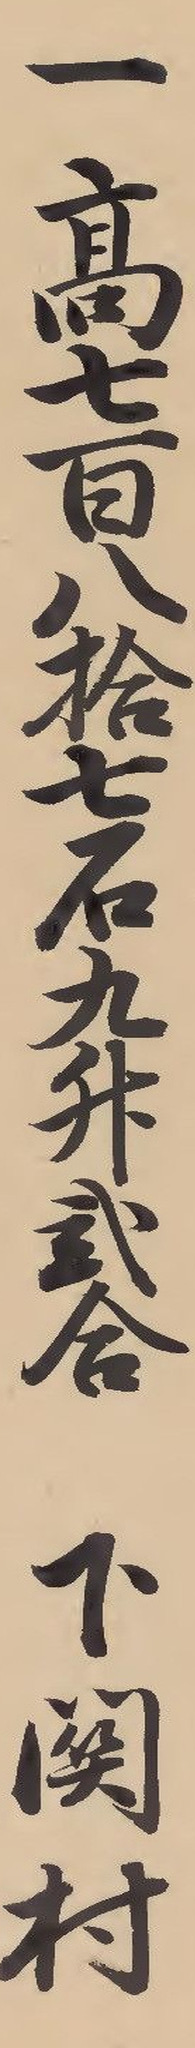一高七百八拾七石九升弐合下関村

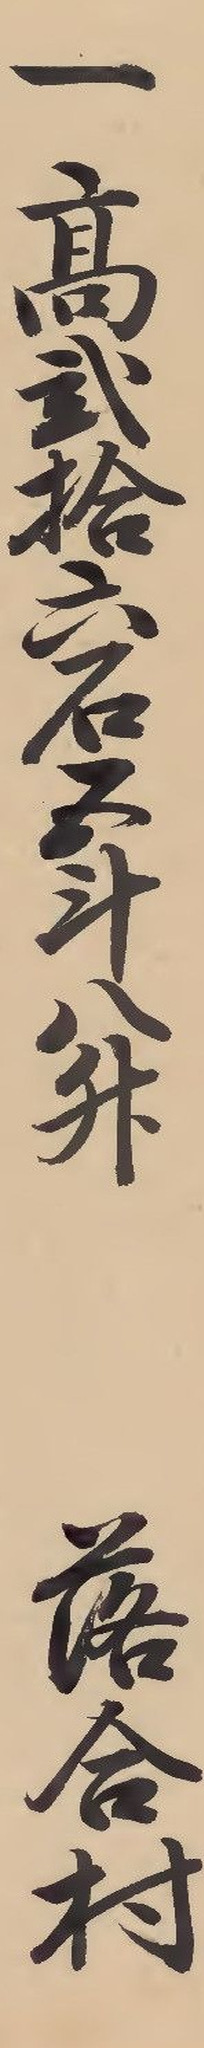一高弐拾六石五斗八升落合村
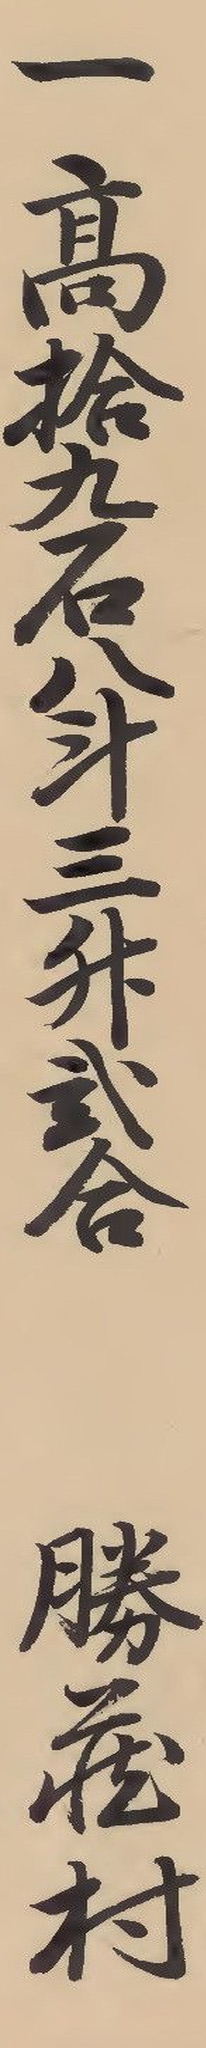一高拾九石八斗三升弐合勝蔵村
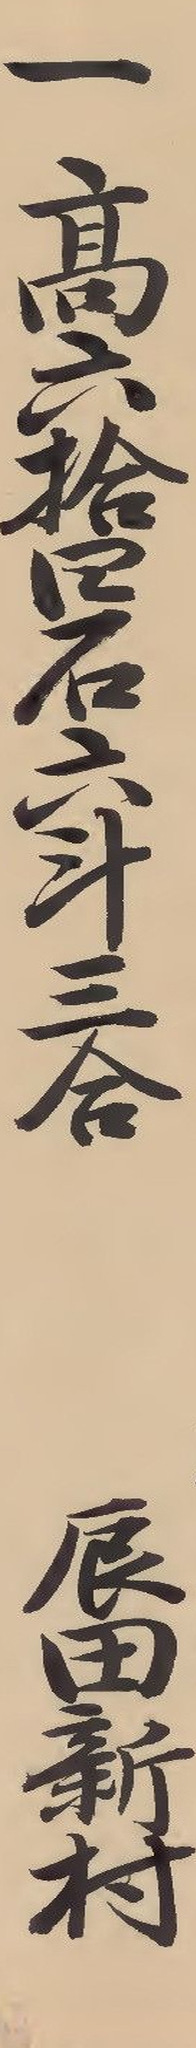一高六拾四石六斗三合辰田新村
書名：越後国郷帳　下
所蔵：国立公文書館 National Archives of Japan
